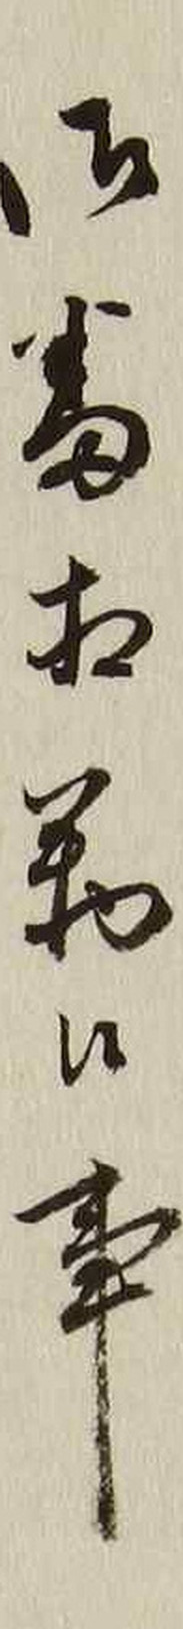御番相勤め候事
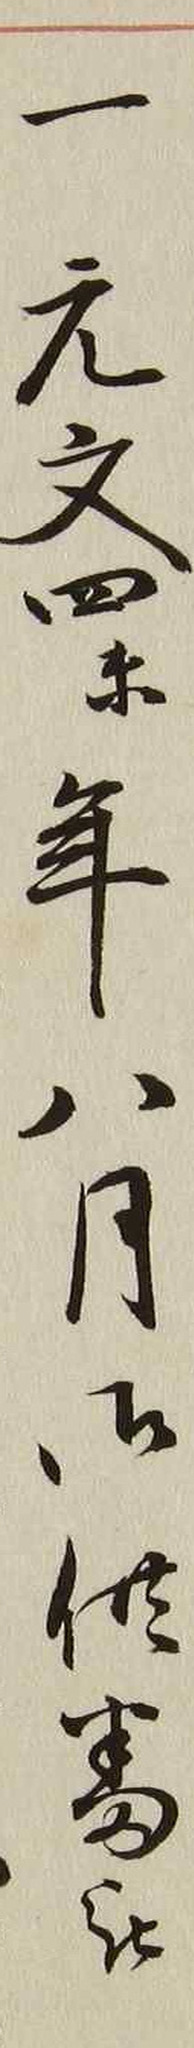一元文四未年八月御供番
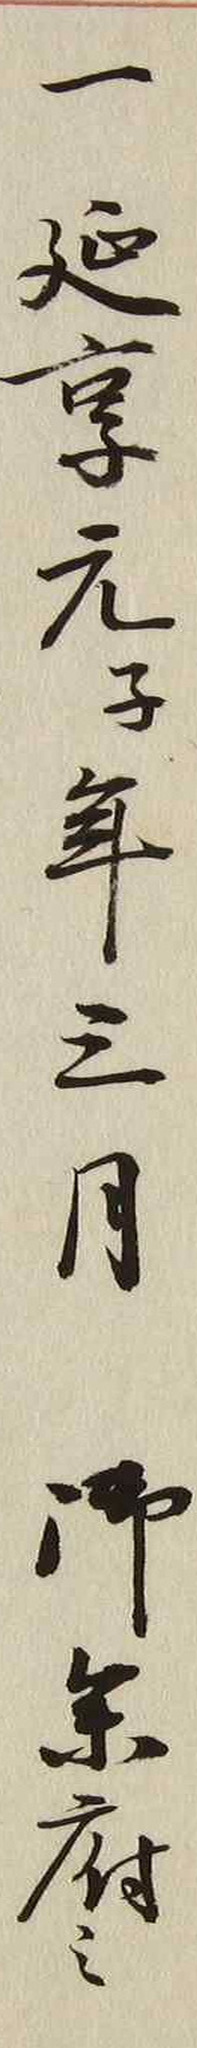一延享元子年三月御参府之
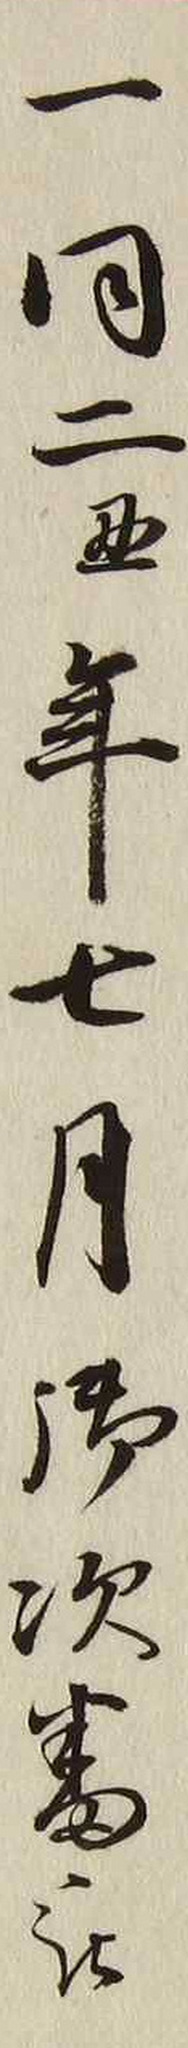一同二丑年七月御次番
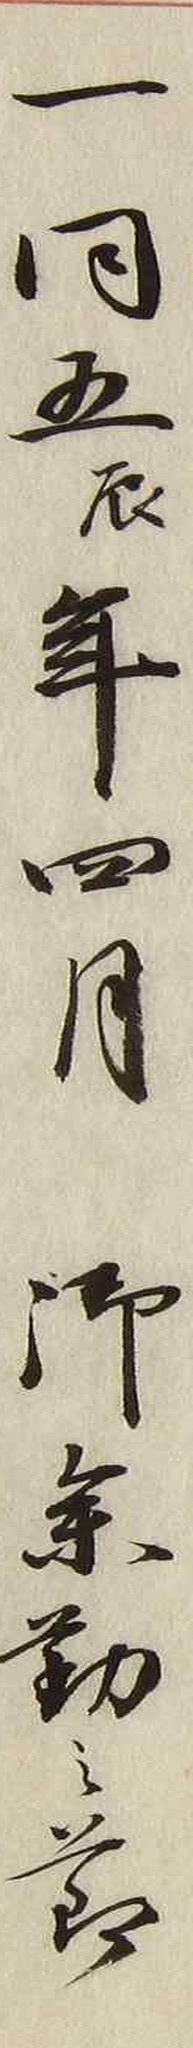一同五辰年四月御参勤之節
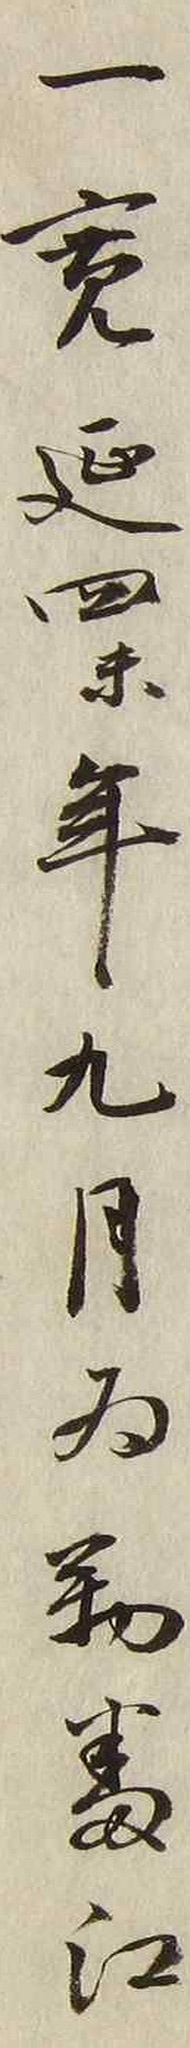一寛延四未年九月勤番之為江

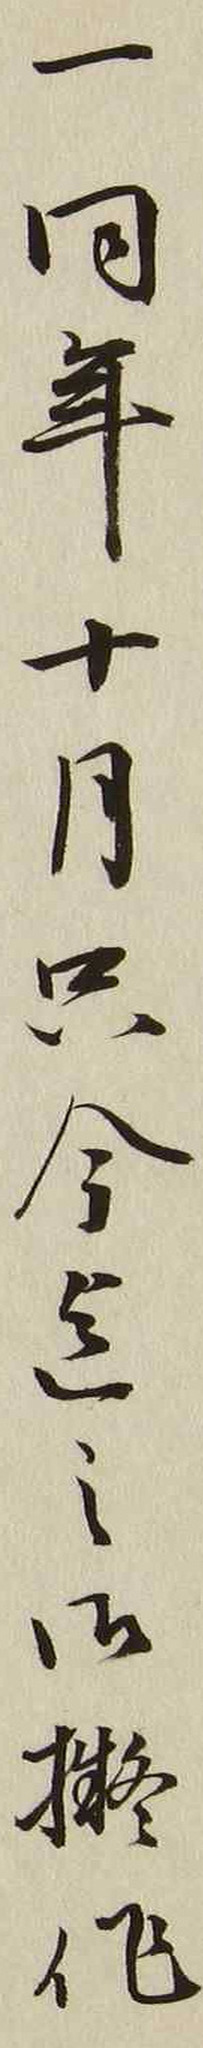一同年十月只今迄之御擬作
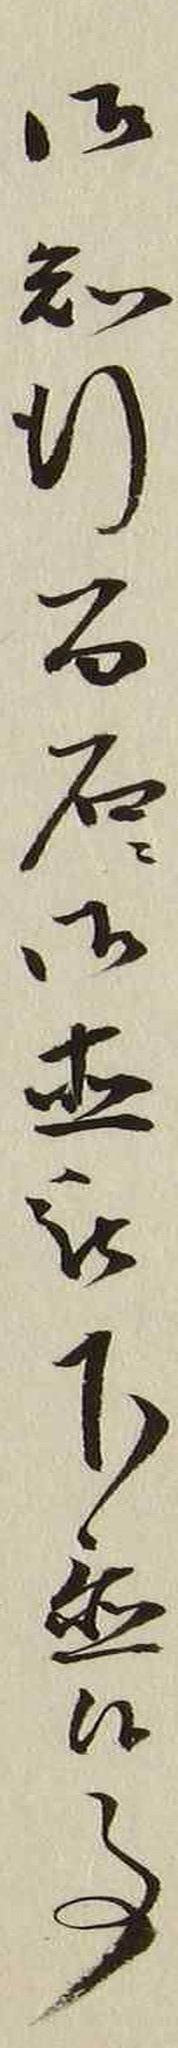御知行百石ニ御直下し置かれ候事
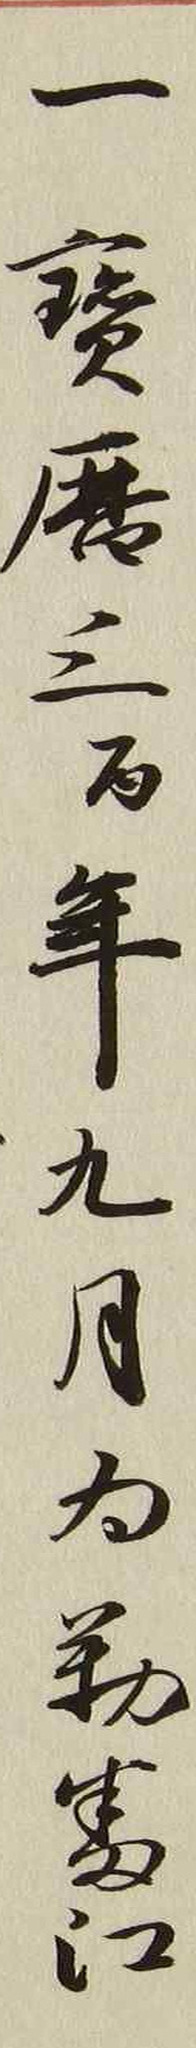一宝暦三酉年九月勤番之為江
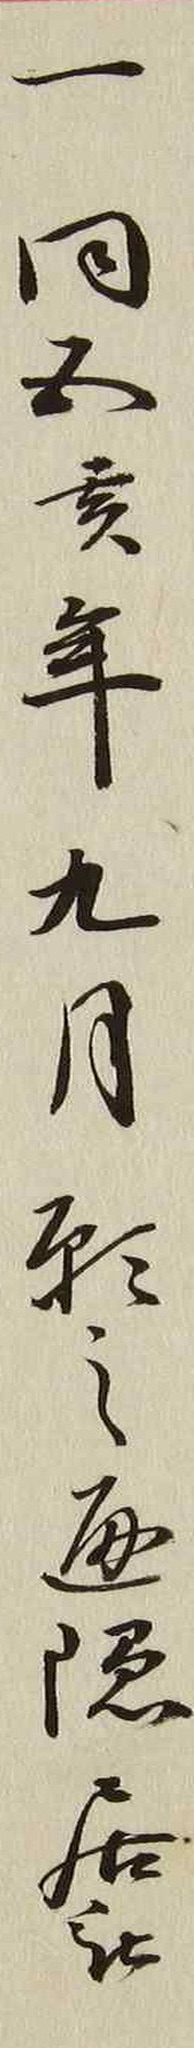一同五亥年九月願之通り隠居
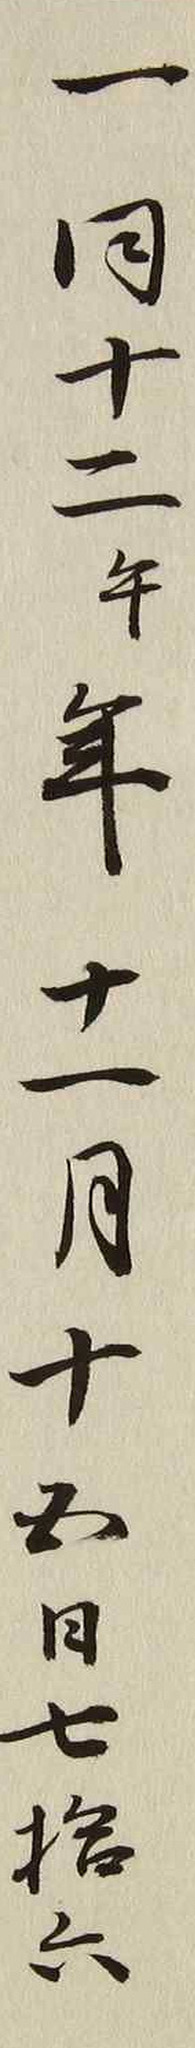一同十二午年十一月十五日七拾六
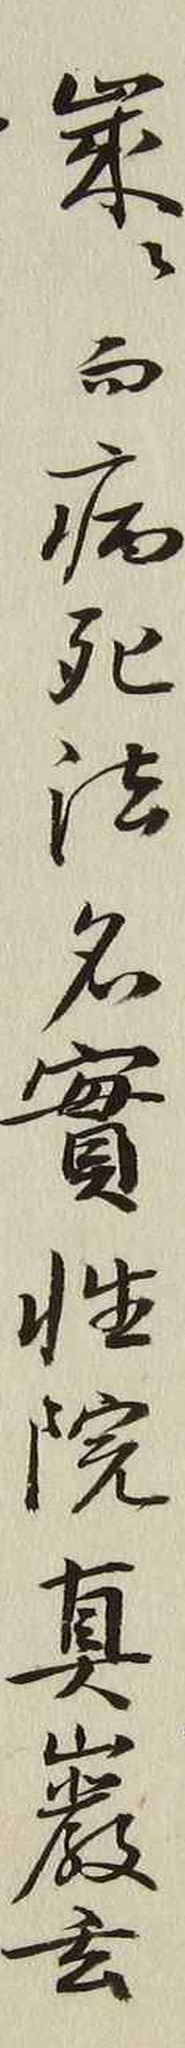歳ニて病死法名実姓院真巌玄
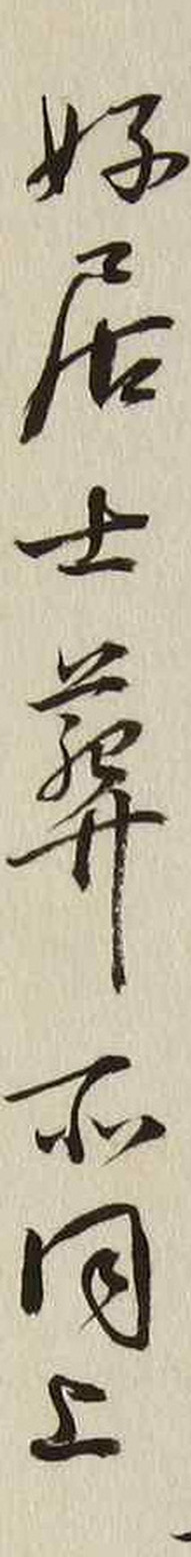好居士葬所同所
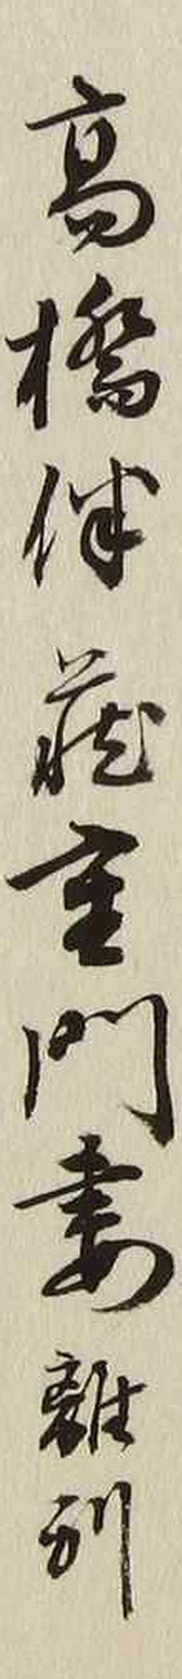女高橋伴蔵重門妻離別
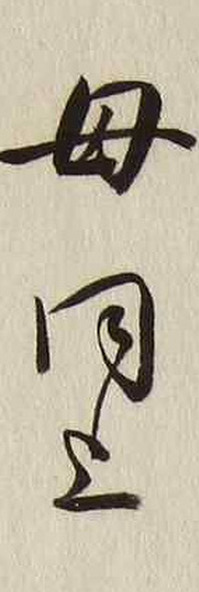母同上
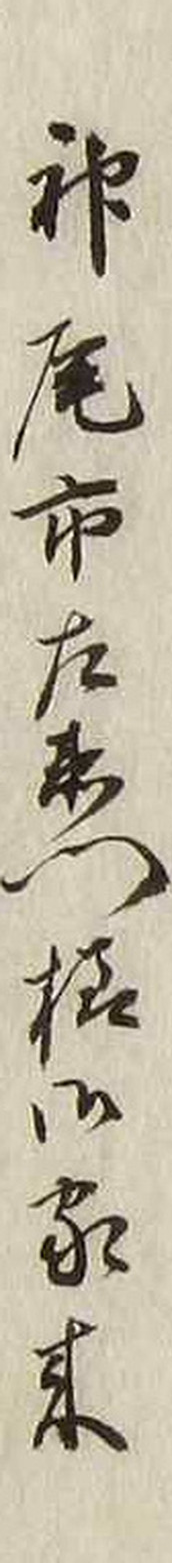神尾市左衛門様御家来
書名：諸士系譜　巻之19　い之部19
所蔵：会津若松市立会津図書館
